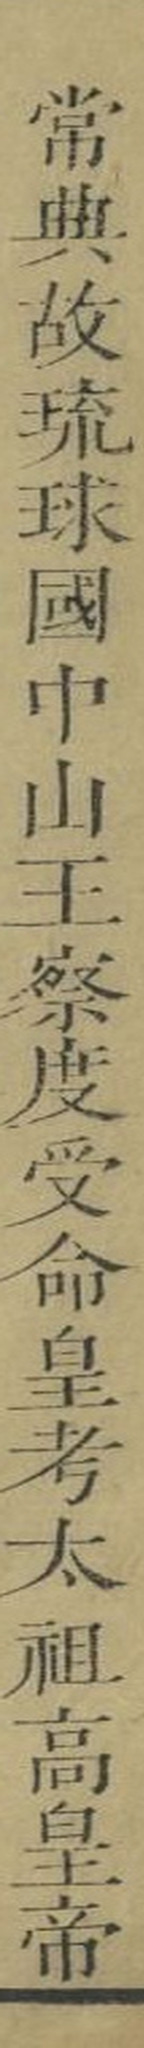常典故琉球国中山王察度受命皇考太祖高皇帝
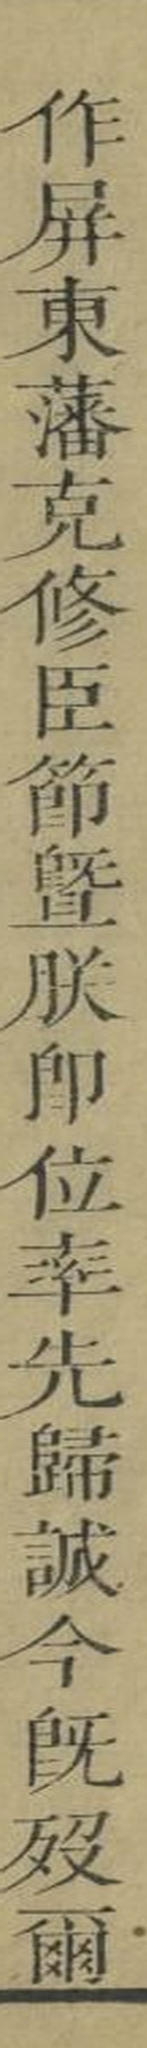作屏東藩克修臣節曁朕即位率先帰誠今既歿爾
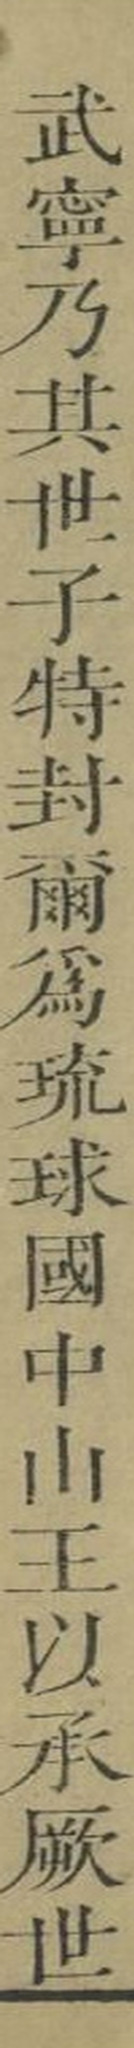武寧乃其世子特封爾為琉球国中山王以承厥世
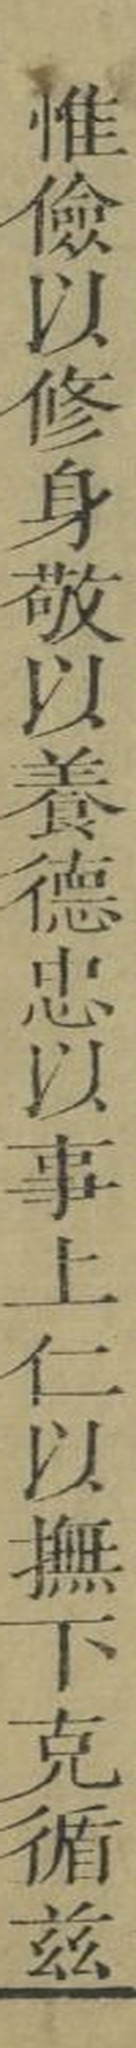惟倹以修身敬以養徳忠以事上仁以撫下克循茲
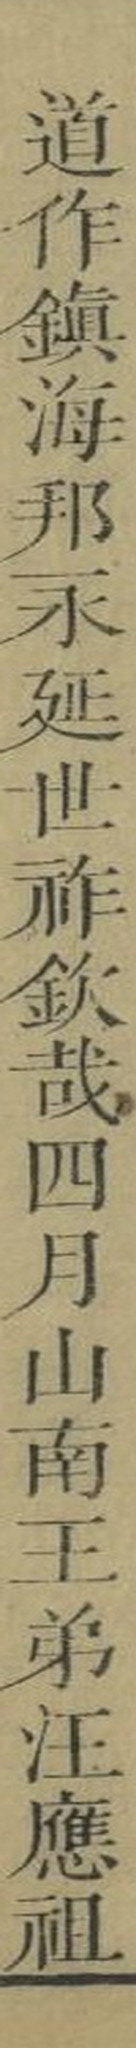道作鎮海邦永延世祚欽哉四月山南王弟汪応祖
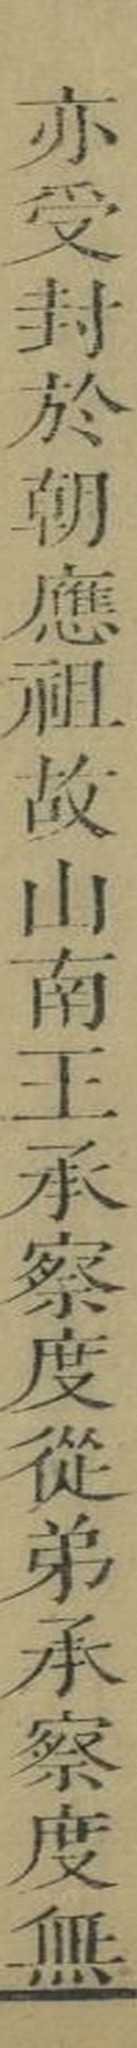亦受封於朝応祖故山南王承察度従弟承察度無
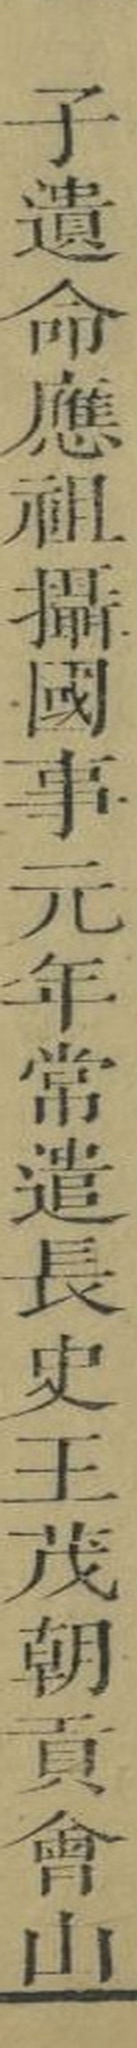子遺命応祖摂国事元年常遣長史王茂朝貢会山
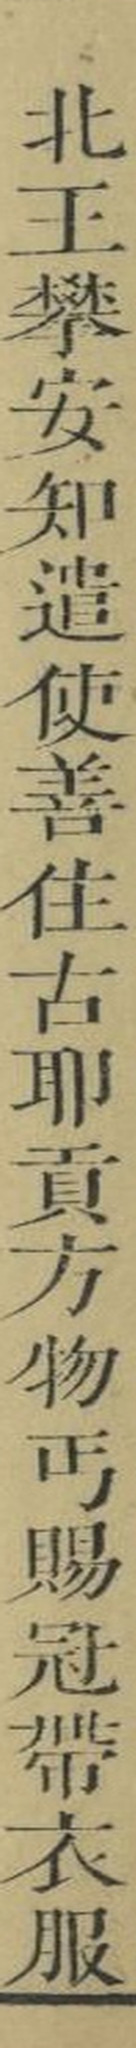北王攀安知遣使善住古耶貢方物丐賜冠帯衣服
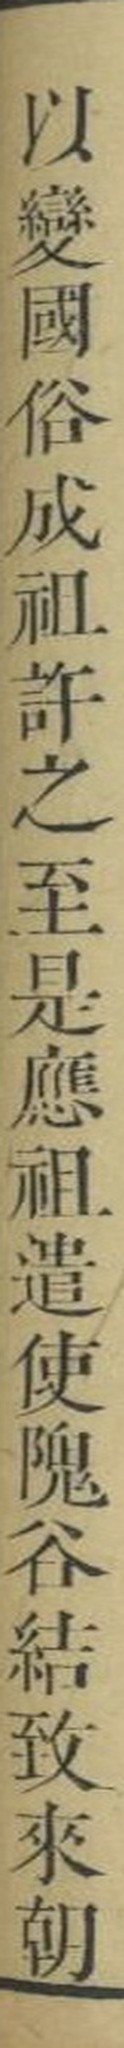以変国俗成祖許之至是応祖遣使隗谷結致来朝
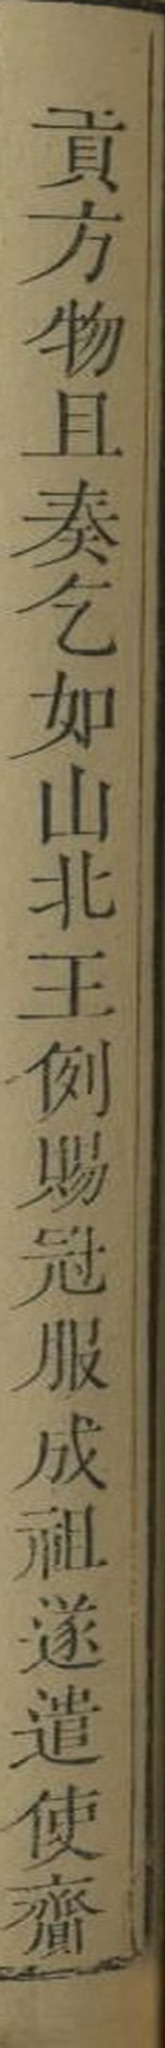貢方物且奏乞如山北王例賜冠服成祖遂遣使齎
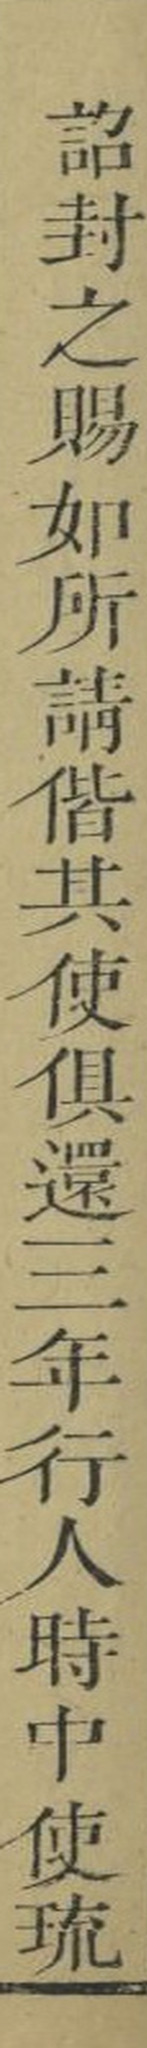詔封之賜如所請偕其使俱還三年行人時中使琉
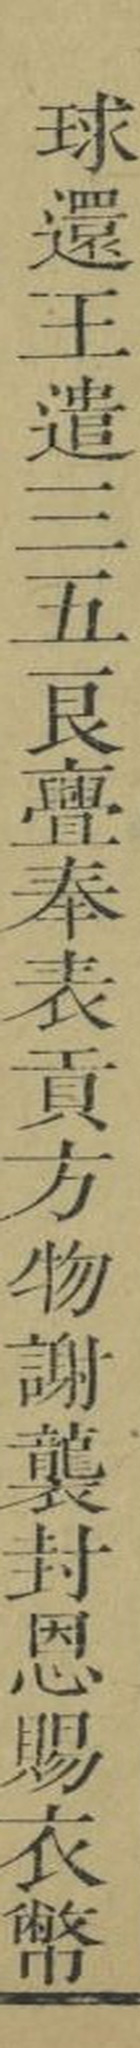球還王遣三五良亹奉表貢方物謝襲封恩賜衣幣
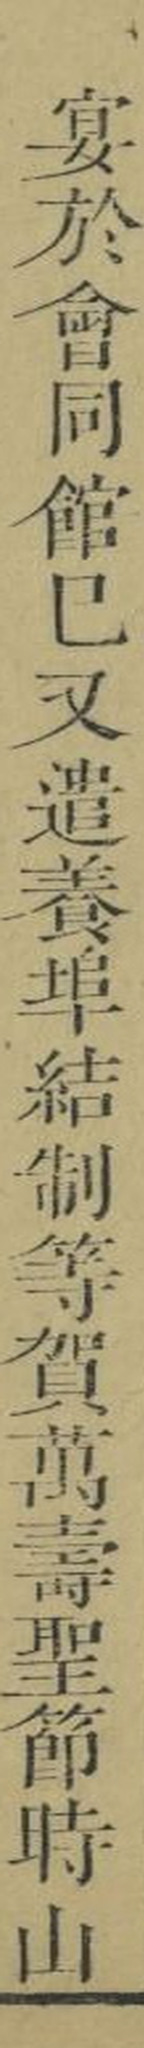宴於会同館巳又遣養埠結制等賀万寿聖節時山
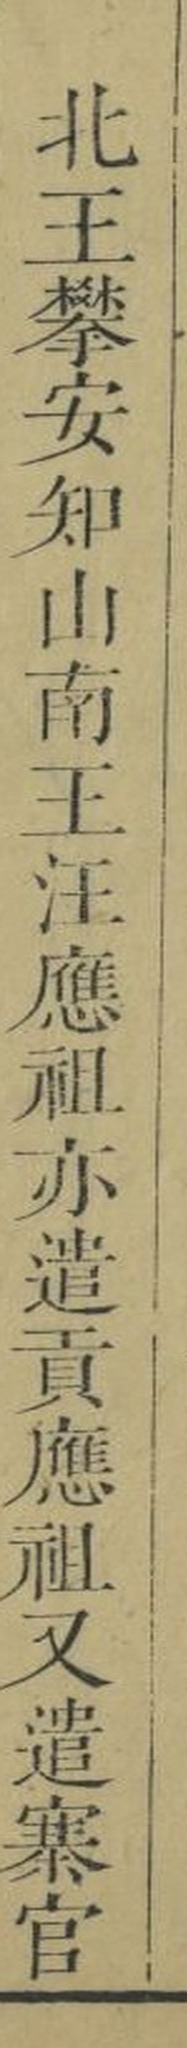北王攀安知山南王汪応祖亦遣貢応祖又遣寨官
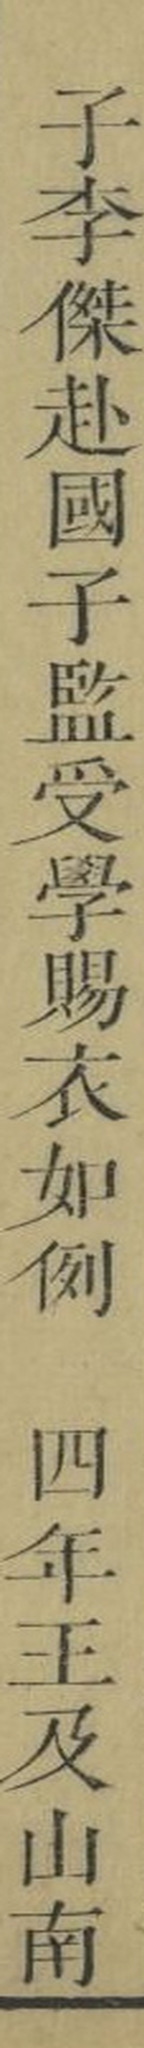子李傑赴国子監受学賜衣如例四年王及山南
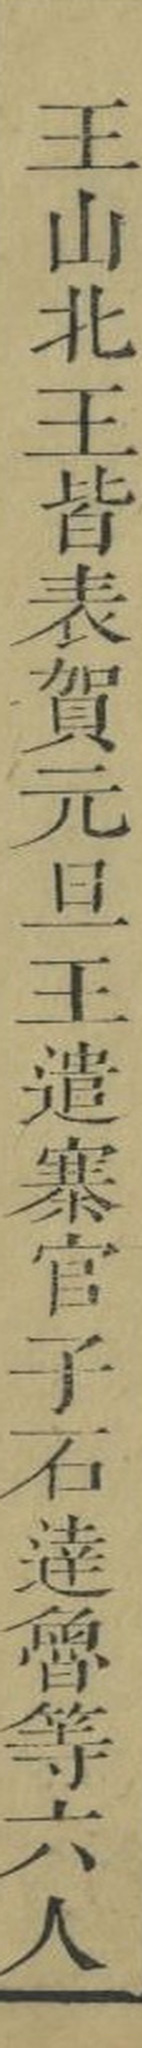王山北王皆表賀元旦王遣寨官子石達魯等六人
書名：中山伝信録 巻三
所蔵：University of the Ryukyus Library
